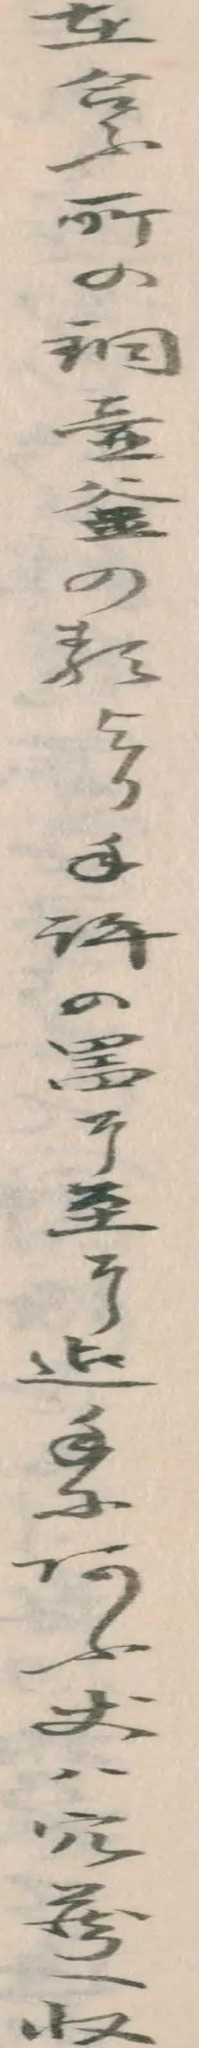在合ふ所の銅壷釜の類より手許の器に至に迄手にあふ丈は穴蔵へ収
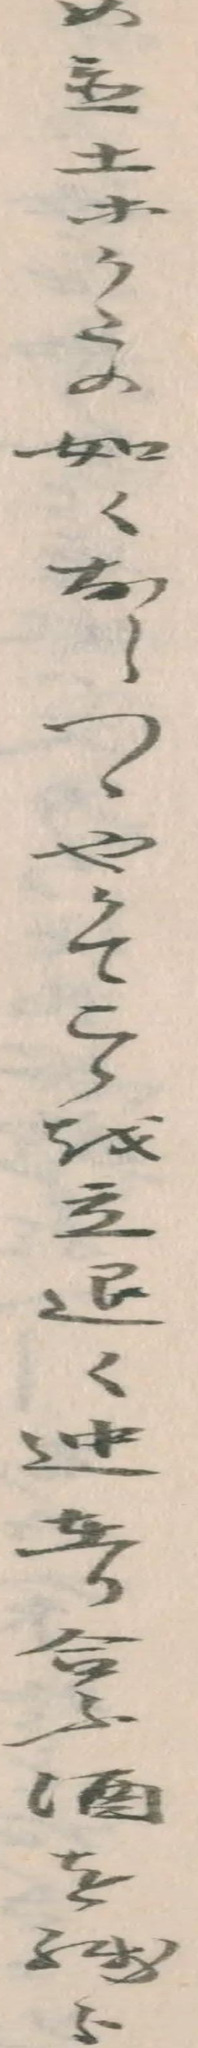め置土等かたの如くなしつゝやかてこゝを立退く迚在り合ふ酒を残ら
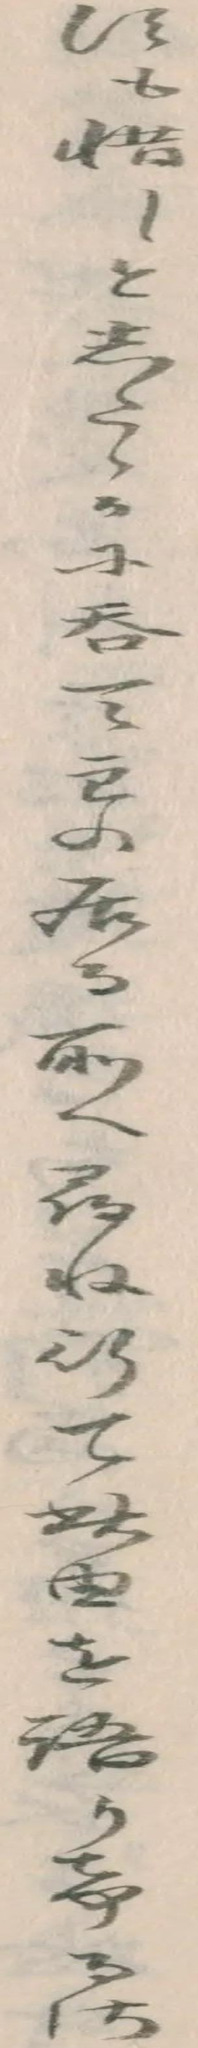すも惜しとしたゝかに吞て主の居る所へ尋ね行て此由を語りけるさ
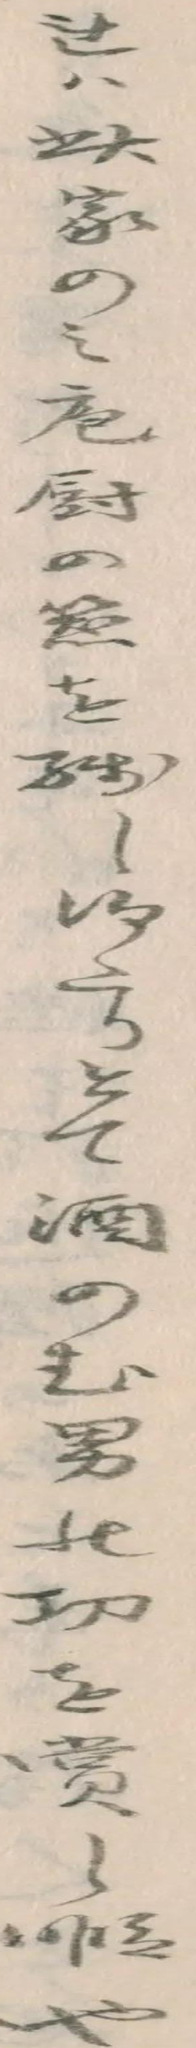れは此家のみ庖厨の器を残し得たりとて酒のむ男の功を賞し暇や
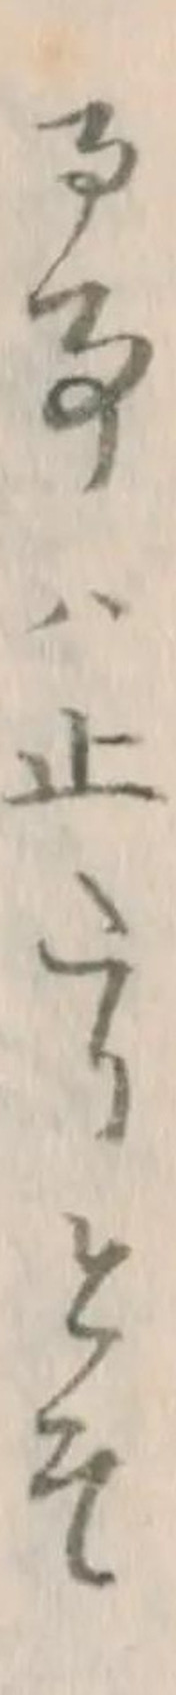る事は止たりとそ
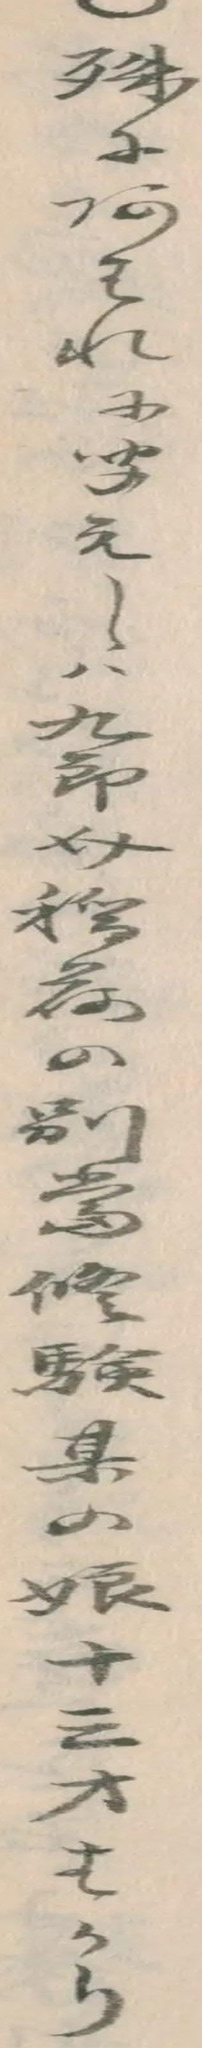〇殊にあはれに聞えしは九郎介稲荷の別当修験某の娘十三才はかり

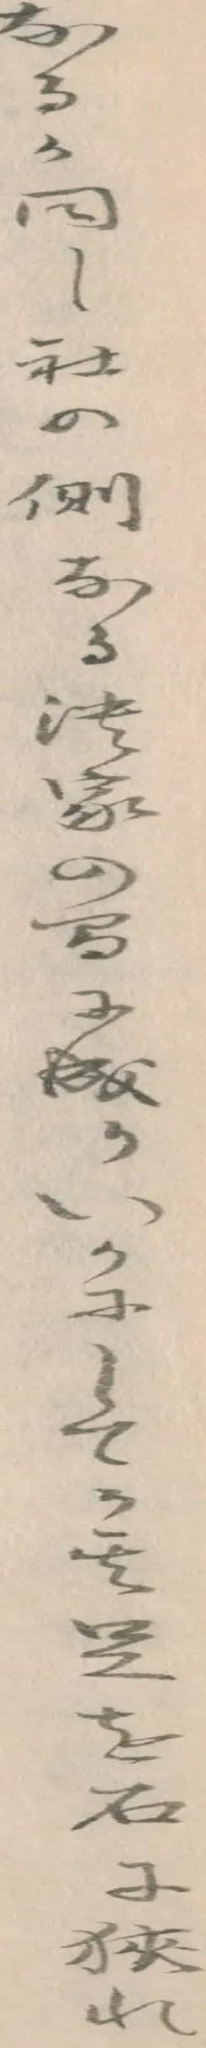なるか同し社の側なる潰家の間に成りいかにしてか其足を石に挟れ
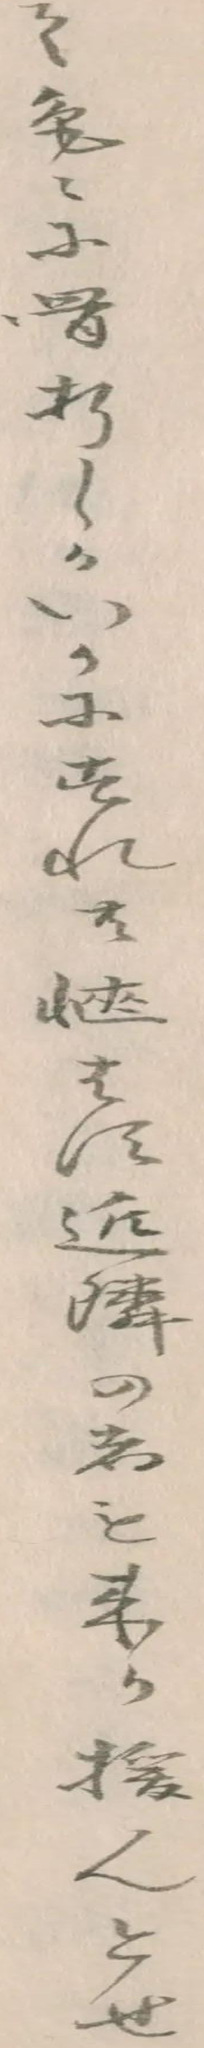て色々に骨折しかいかにすれ共愜はす近隣の者も来り援んとせ
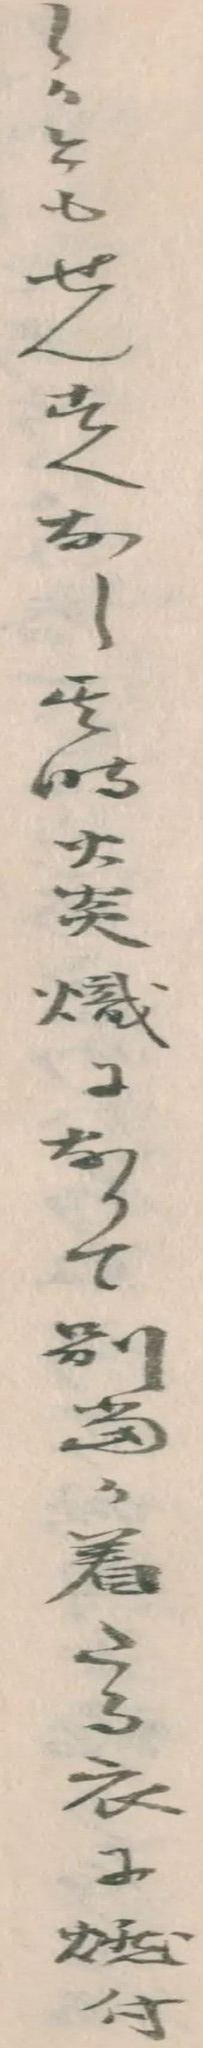しかともせんすへなし其時火災熾になりて別当か着たる衣に燃付
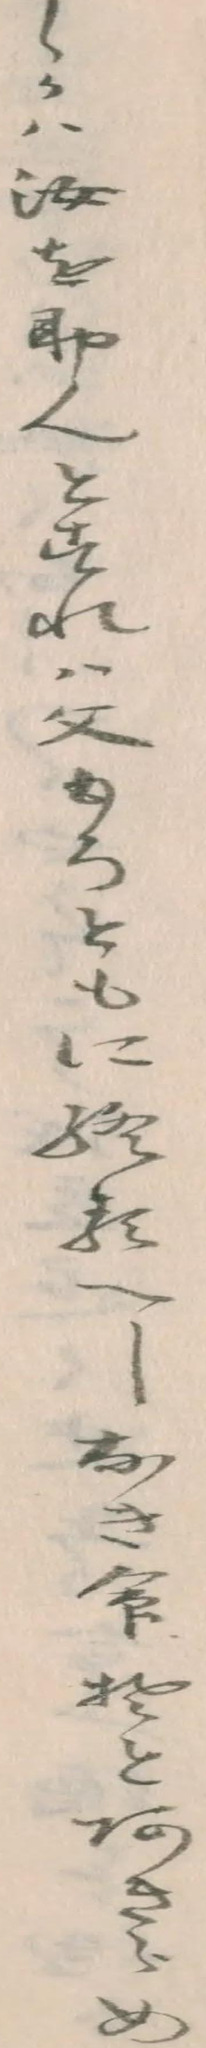しかは汝を助んとすれは父もろともに終るへしなき命そとあきらめ
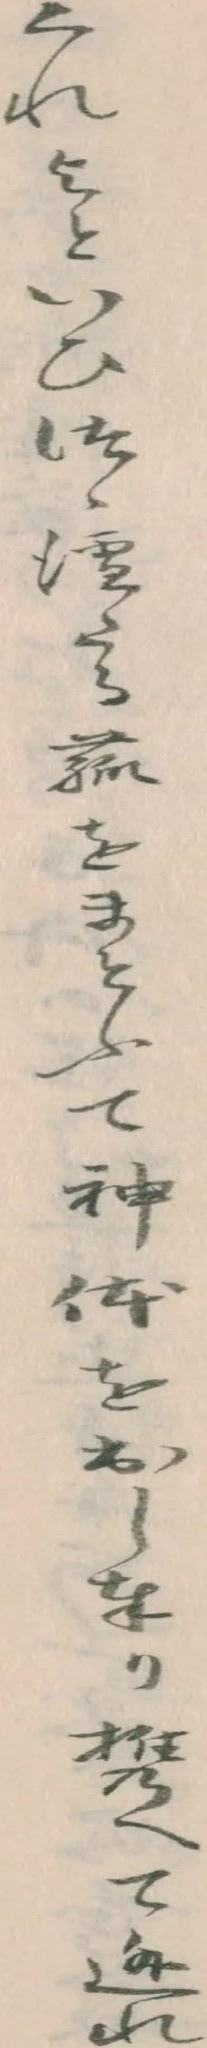くれよといひつゝ濡たる菰をまとふて神体を出し奉り携へて逃れ
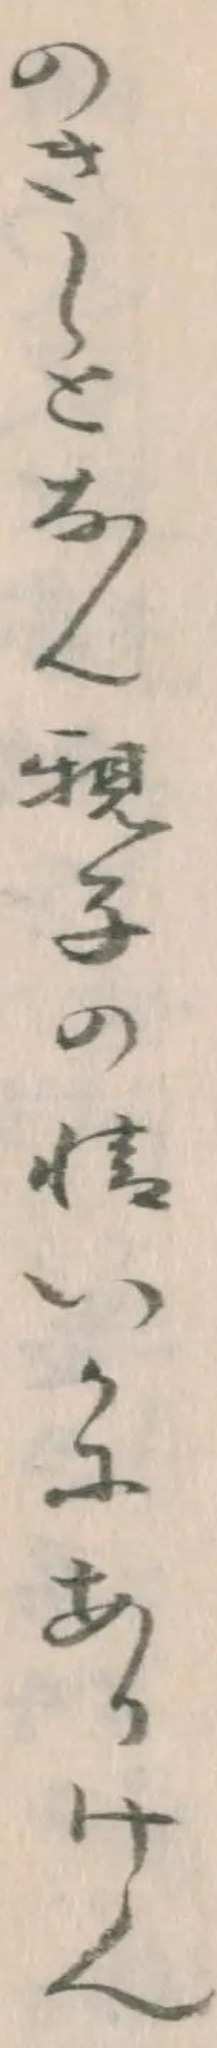のきしとなん親子の情いかにありけん
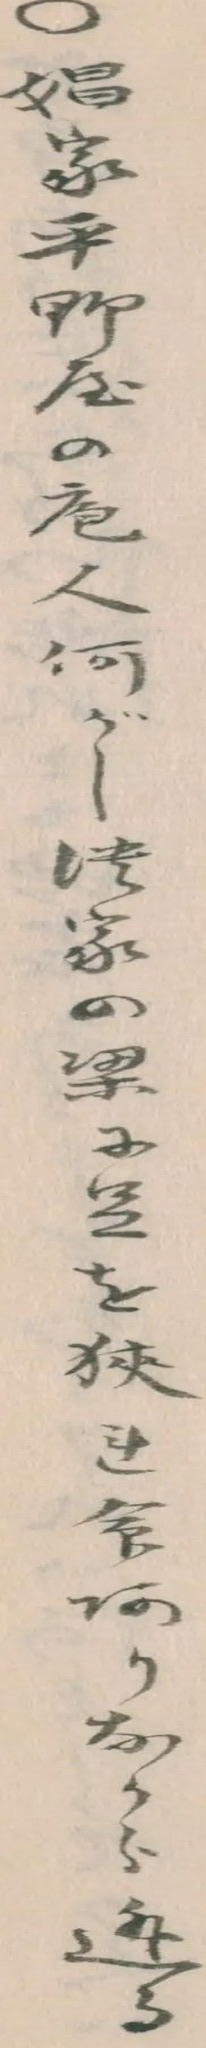〇娼家平野屋の庖人何がし潰家の梁に足を挟れ命ありなから逃る
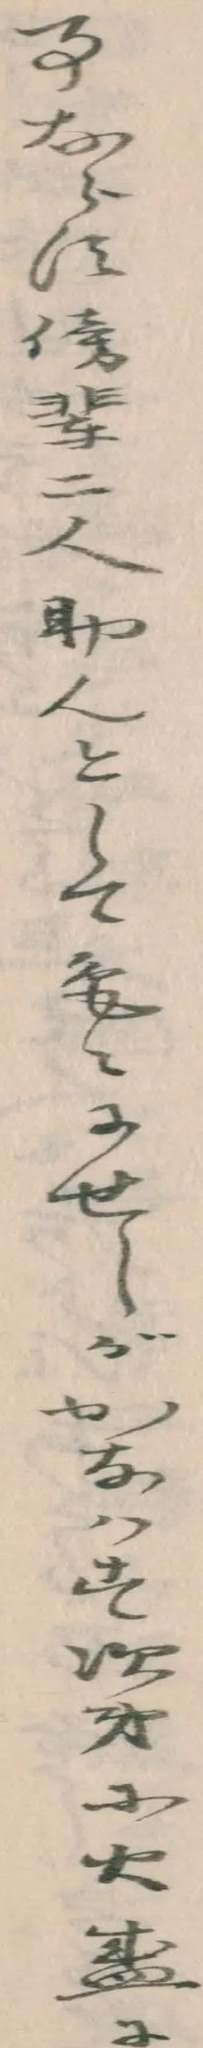事ならす傍輩二人助んとして色々にせしがかなはす次第に火盛に
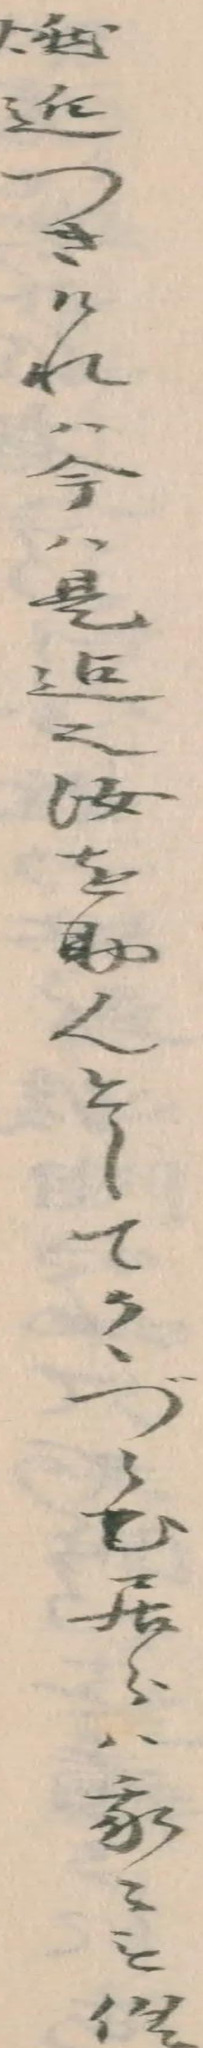燃近つきけれは今は是迄也汝を助んとしてかゝづらひ居らは我々も倶
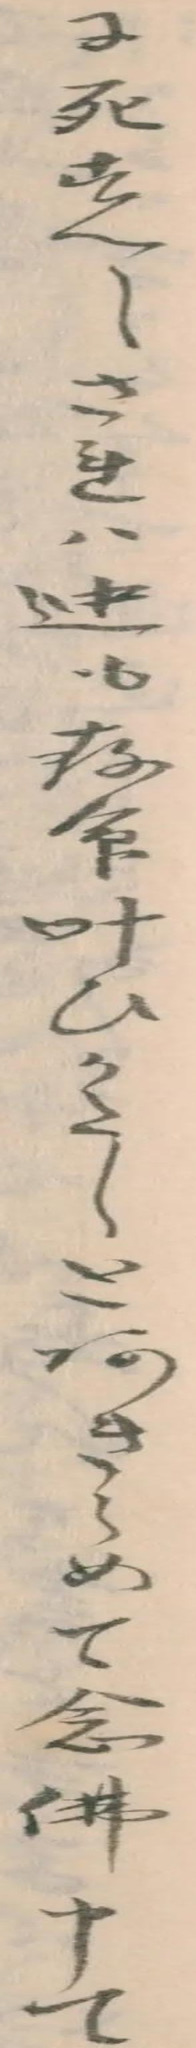に死すへしされは迚も存命叶ひかたしとあきらめて念仏申て
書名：地災撮要. 巻10(地震之部) 上,下
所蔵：国立国会図書館 National Diet Library, JAPAN
